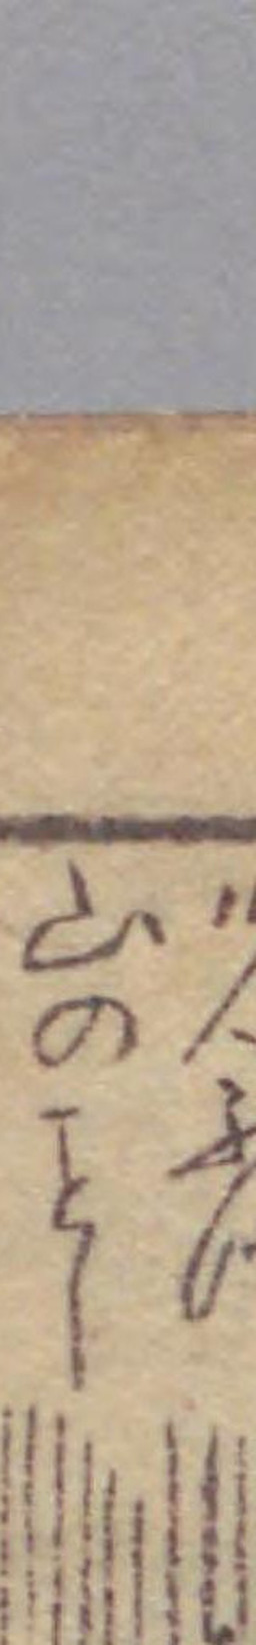山のことし
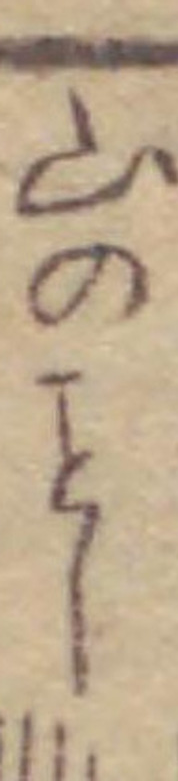山のことし
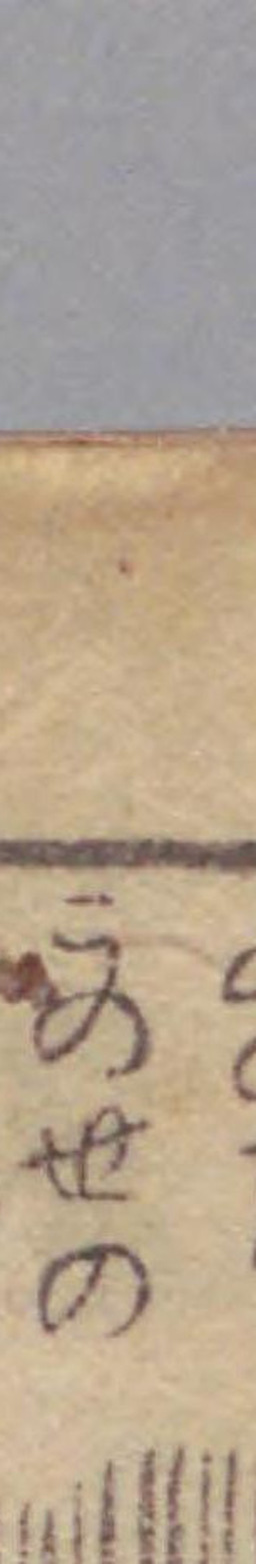この世の
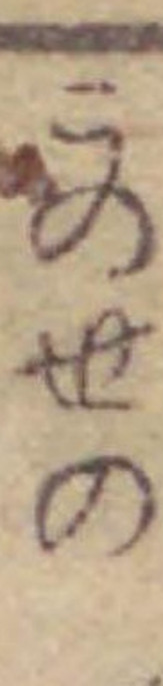この世の
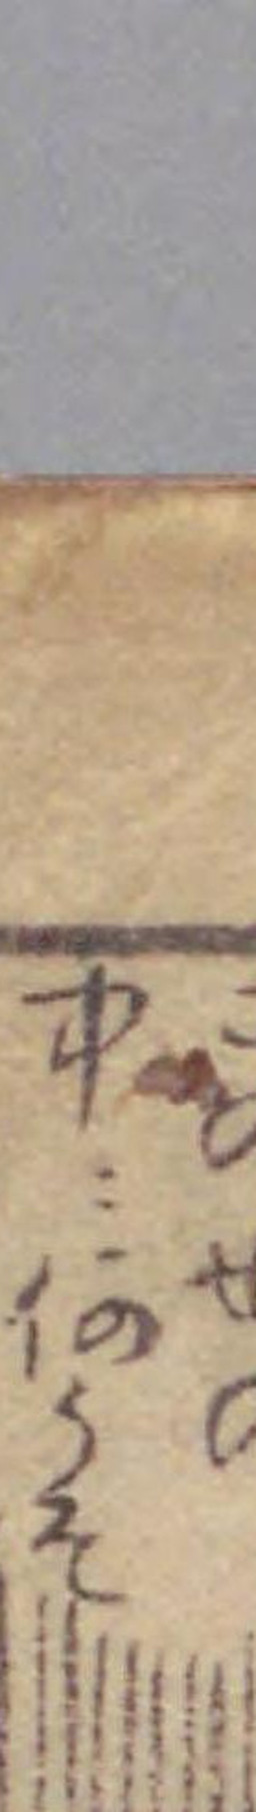中に何うそ
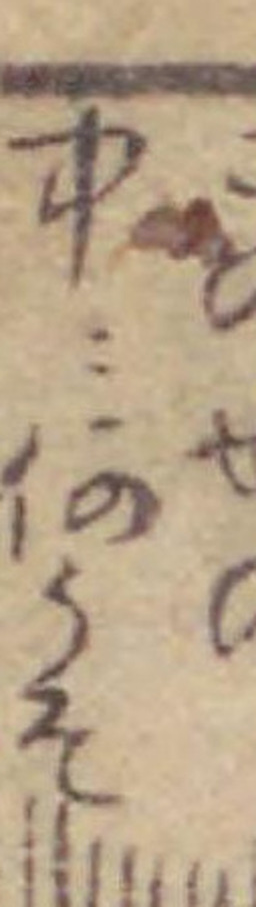中に何うそ
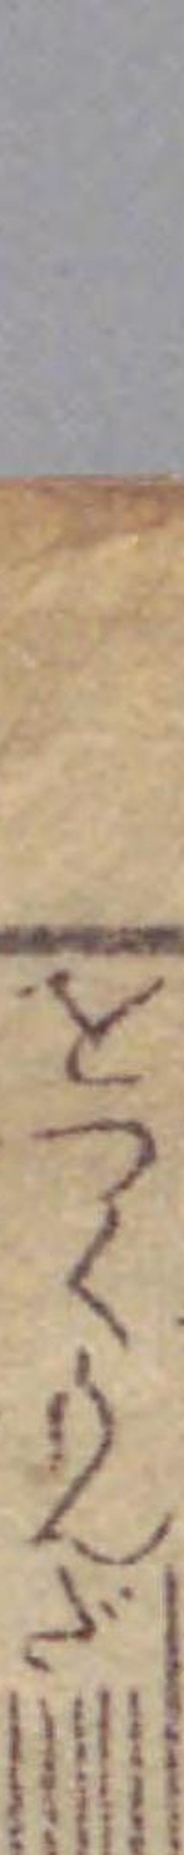をつくもんだ
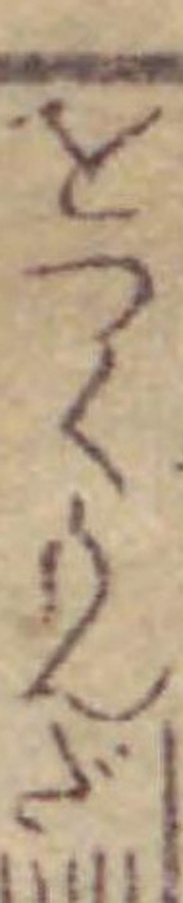をつくもんだ
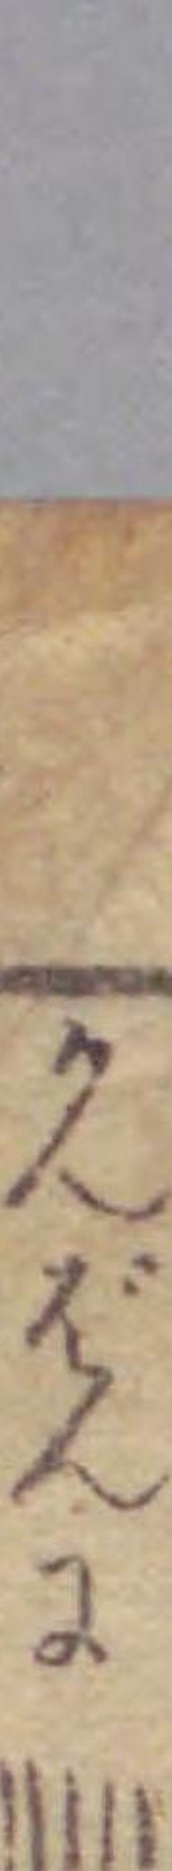かんばんに
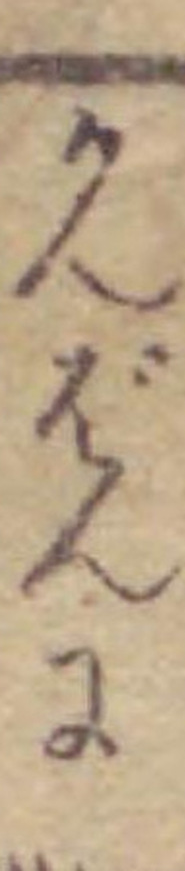かんばんに
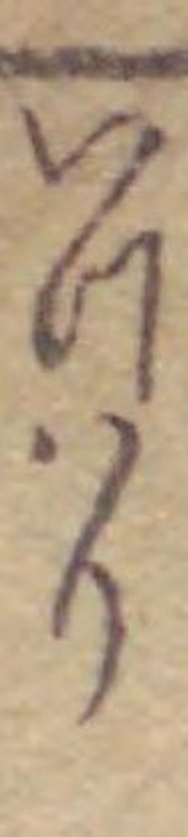いつはり
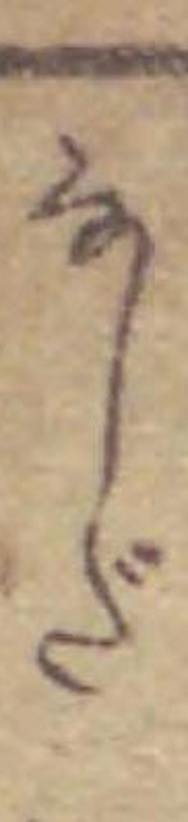なしだ

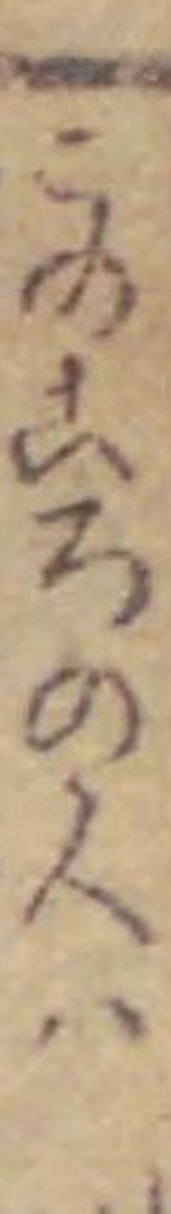このころの人は
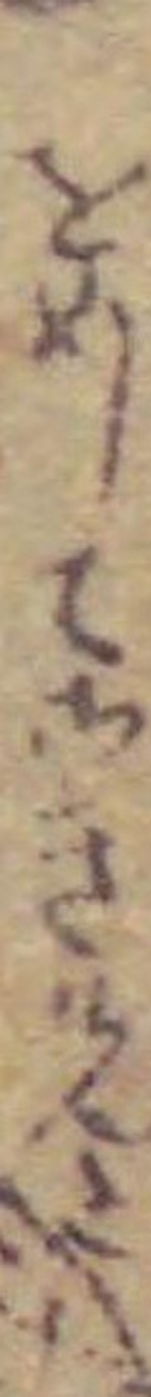をめして御きけんさ
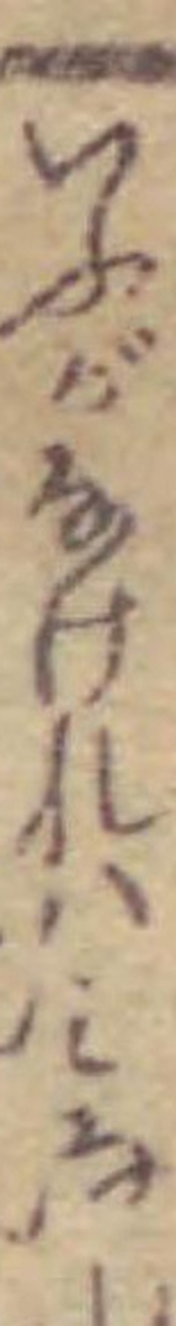いふがなけれはみな
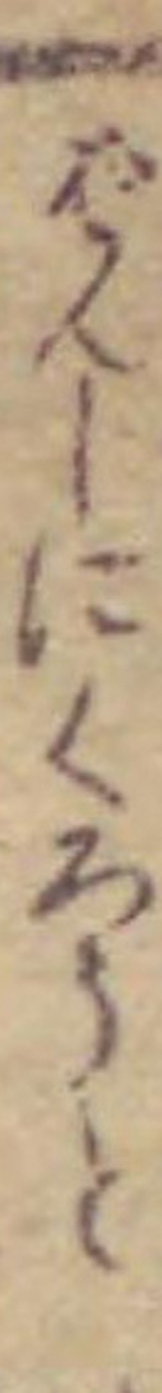ばんしにくろうと
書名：天下一面鏡梅鉢 : 3巻
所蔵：国立国会図書館 National Diet Library, JAPAN
